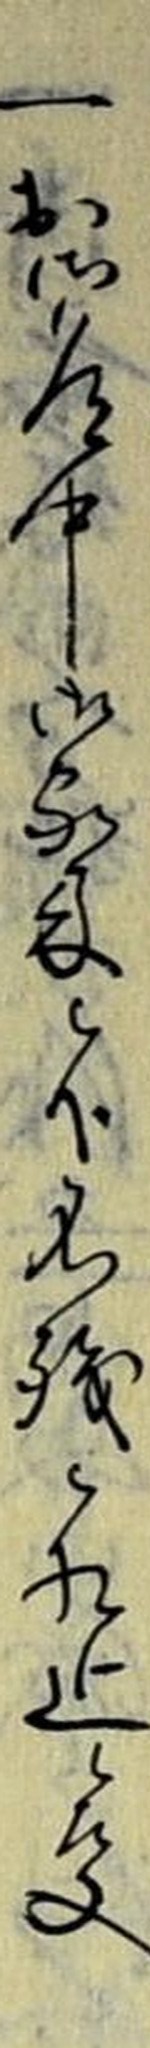一於御道中御家来被下不残被相止候事
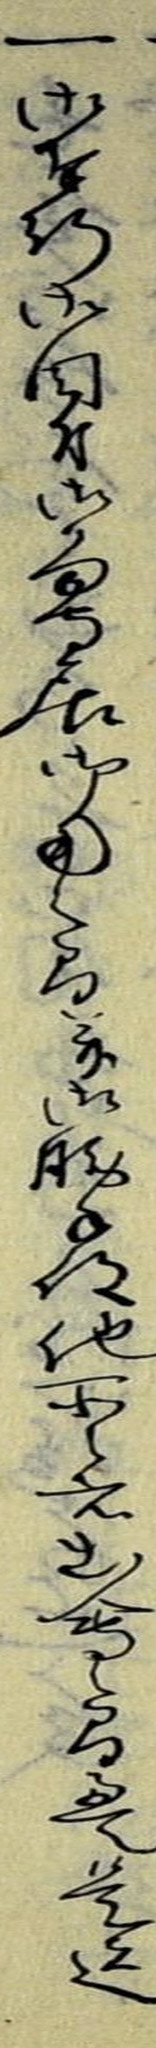一御奉行御目付御留守居御用之間并勝手役他所之者出会之間畳是迄
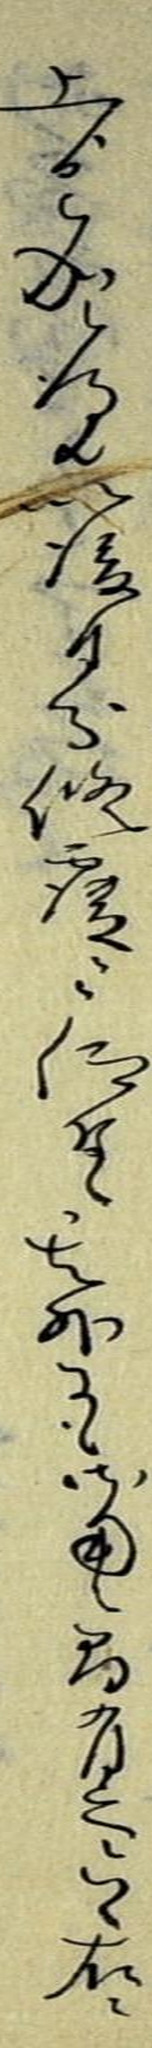上ゟ被成候得共以後自分修覆に被仰付候其外にも御用之間有之候はゝ右に
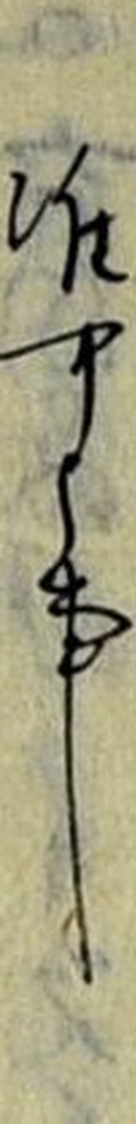准可申事
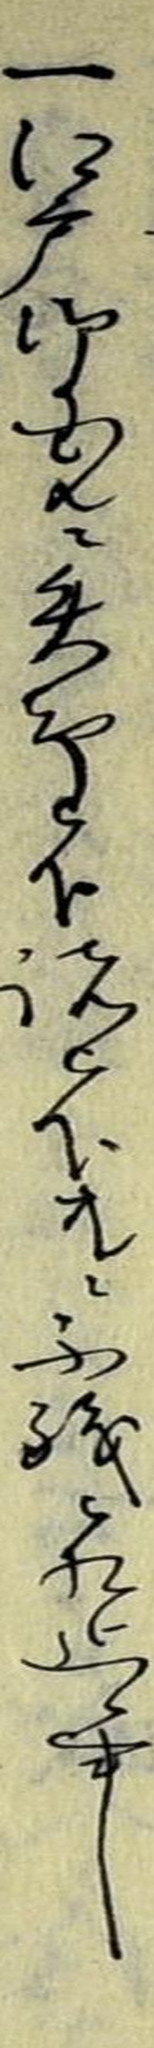一江戸御国共に失却被下諸被下共に不残被相止候事
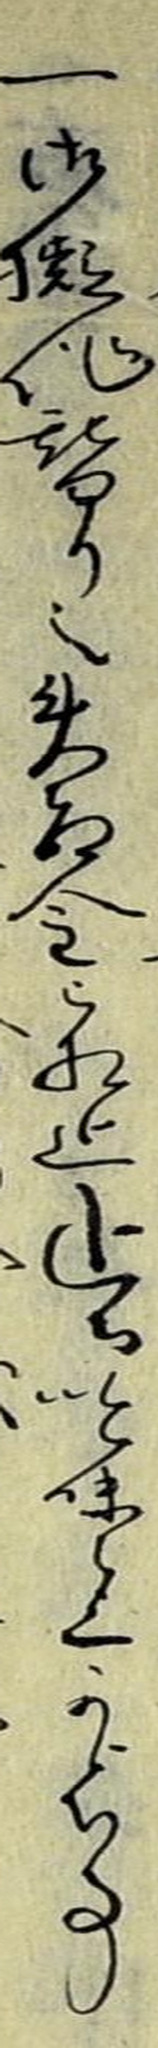一御擬作替り之失却金被相止追而吟味之上可被下事
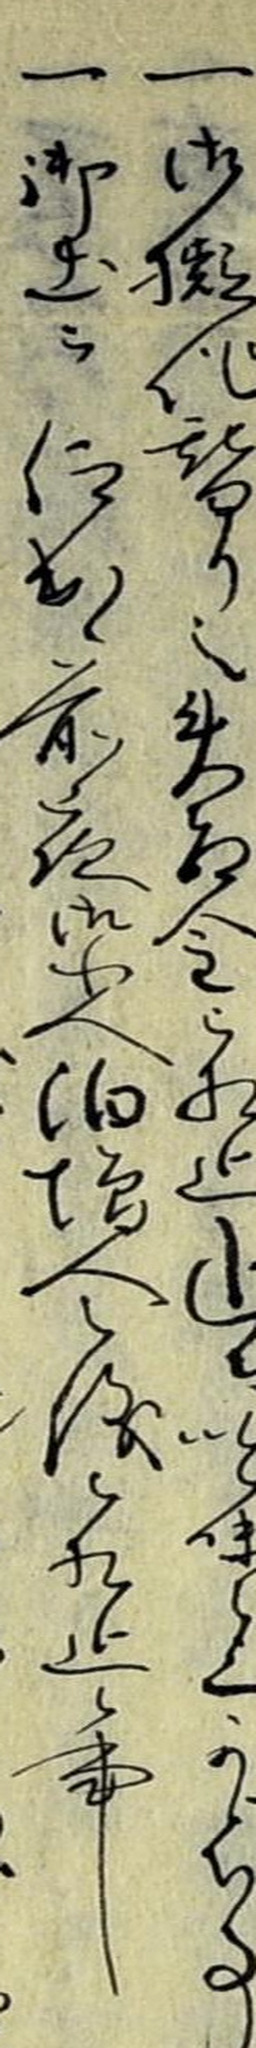一御出被仰出候前夜御小人泊増人之儀被相止候事
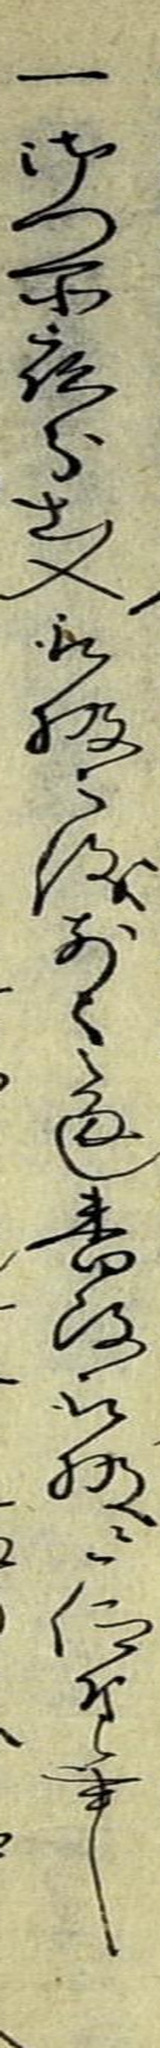一御門所夜分出入取扱之儀前々之通番改取扱に被仰付候事
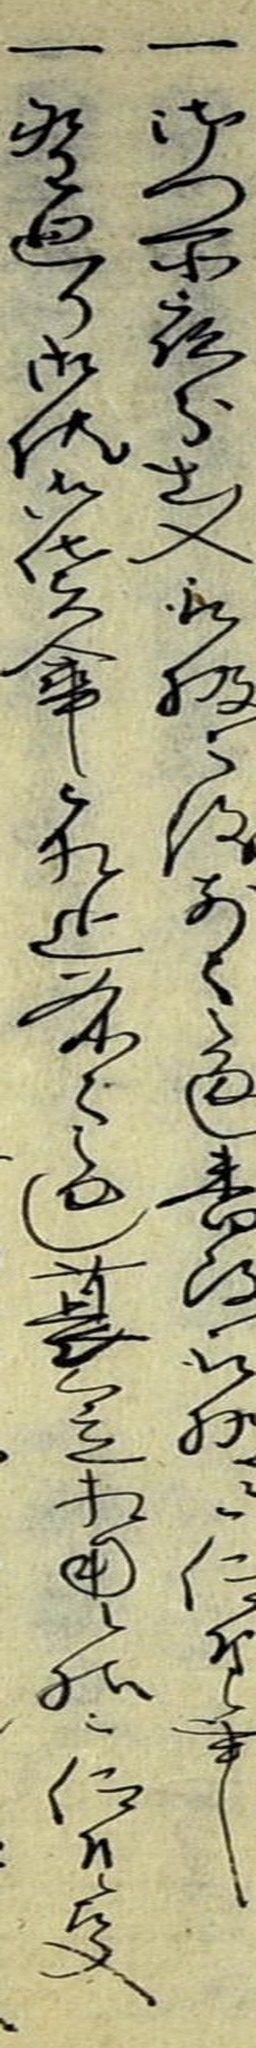一野廻り御供御貸傘被相止前々之通簔笠相用候様被仰付候事
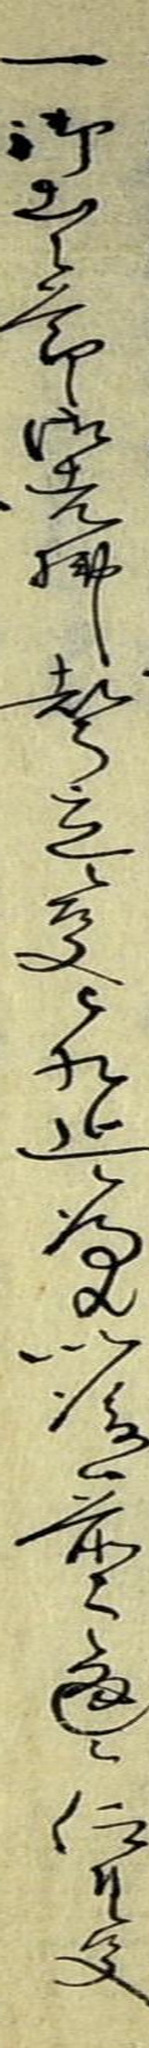一御出之節御先払声立候事被相止候得共以後は前々之通被仰付候事
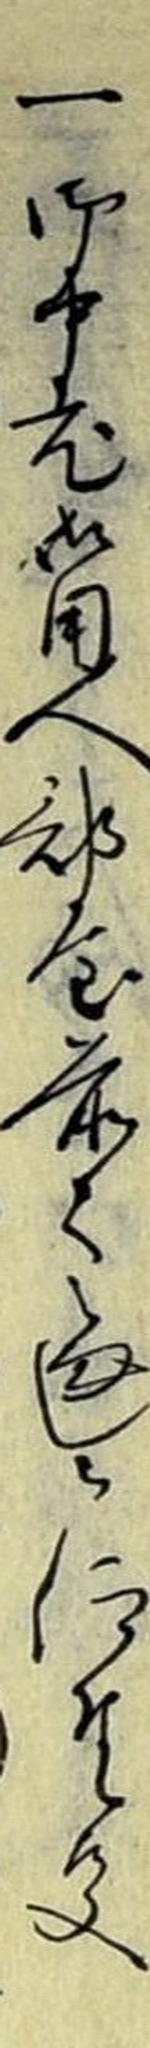一御中老御用人部屋前々之通被仰付候事
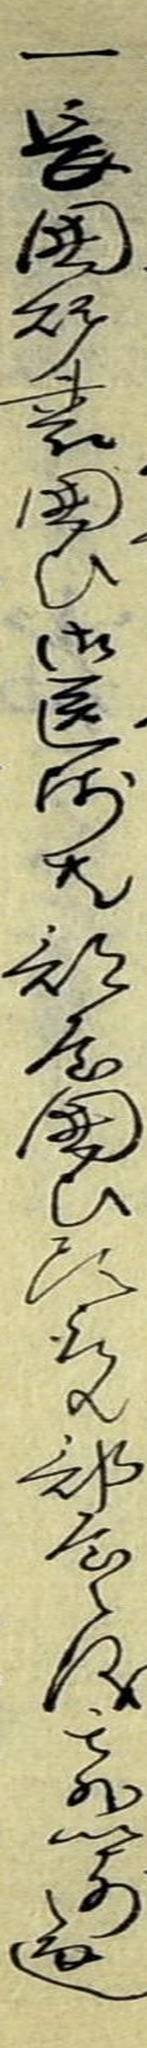一長囲炉裏囲ひ御医師共部屋囲ひ頭取共部屋之儀其外以前之通
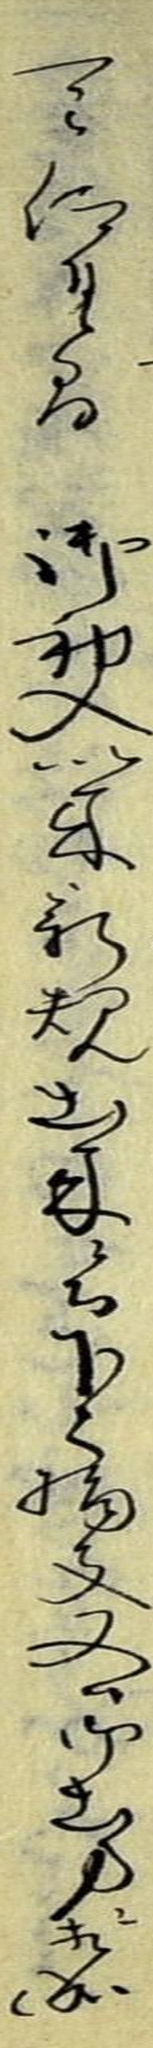可被仰付候間御初入以来新規出来に而下々指支又は御出方に相成
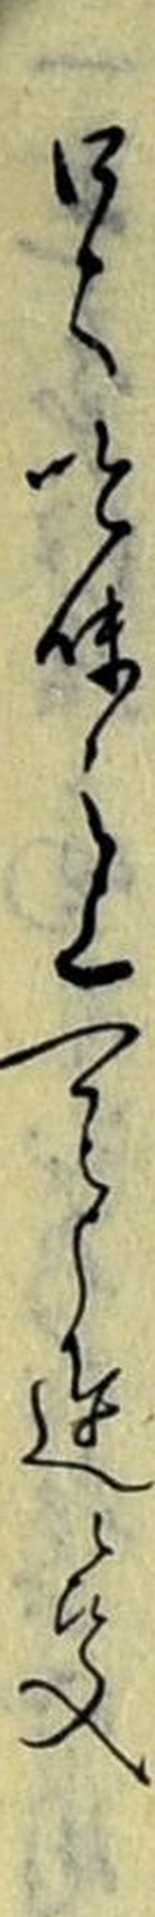口々吟味之上可被申達候事

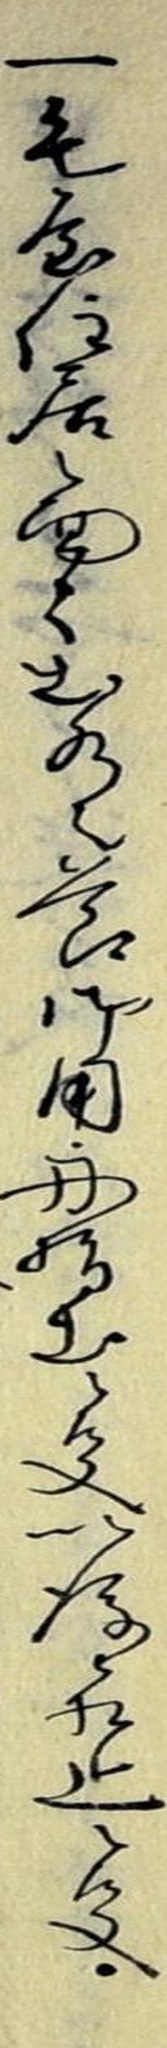一毛屋住居之面々出水之節御用舟指出候事以後被相止候事
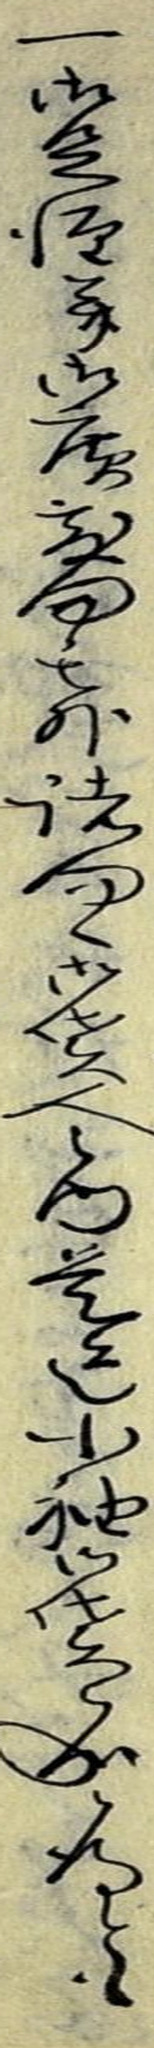一御足軽并御広敷向其外諸向へ御貸人之内是迄小袖御貸被成候得とも
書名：命令之部 二
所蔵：福井県文書館 Fukui Prefectural Archives
